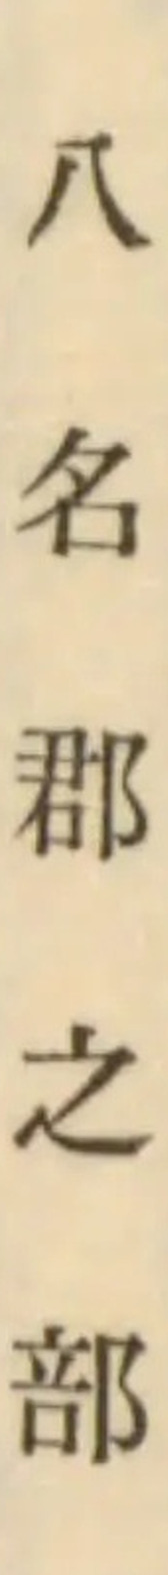八名郡之部
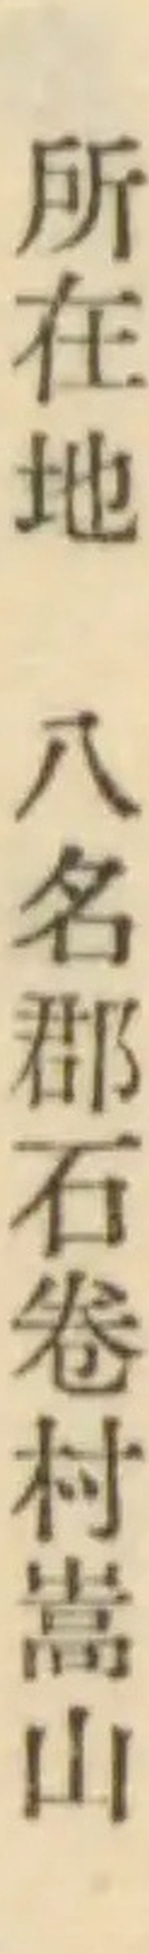所在地八名郡石巻村嵩山
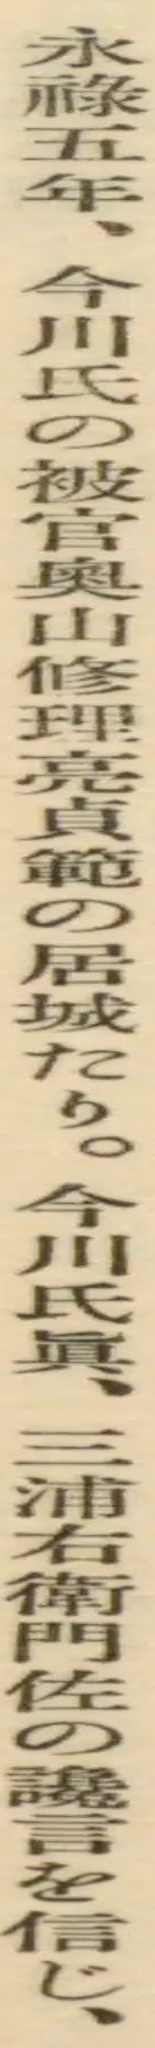永禄五年、今川氏の被官奥山修理亮貞範の居城たり。今川氏眞、三浦右衛門佐の讒言を信じ、
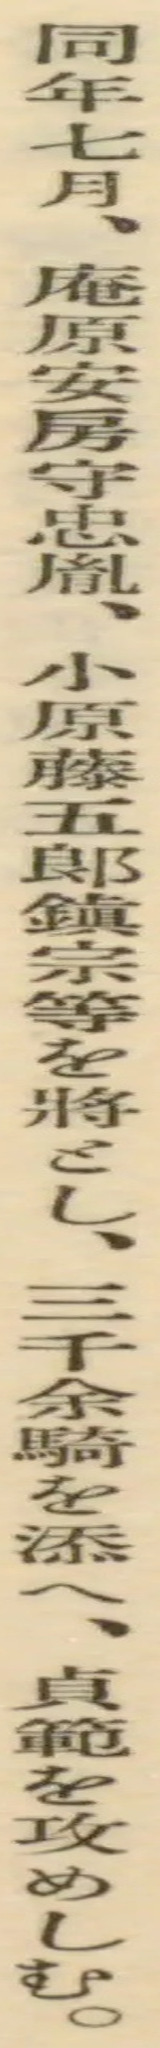同年七月、庵原安房守忠胤、小原藤五郎鎮宗等を将とし、三千余騎を添へ、貞範を攻めしむ。
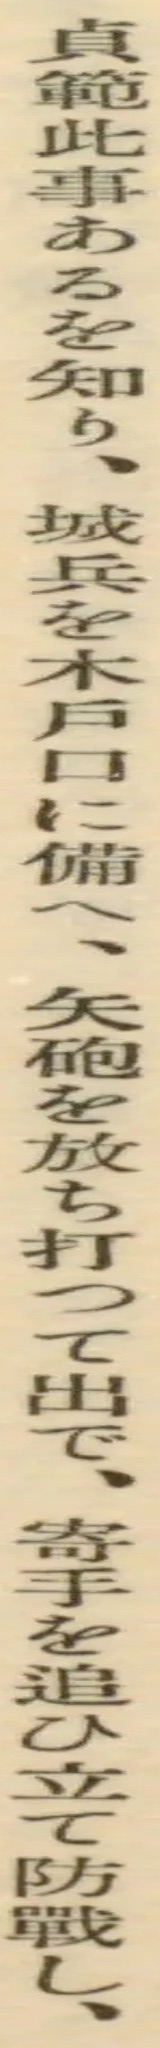貞範此事あるを知り、城兵を木戸口に備へ、矢砲を放ち打つて出で、寄手を追ひ立て防戦し、
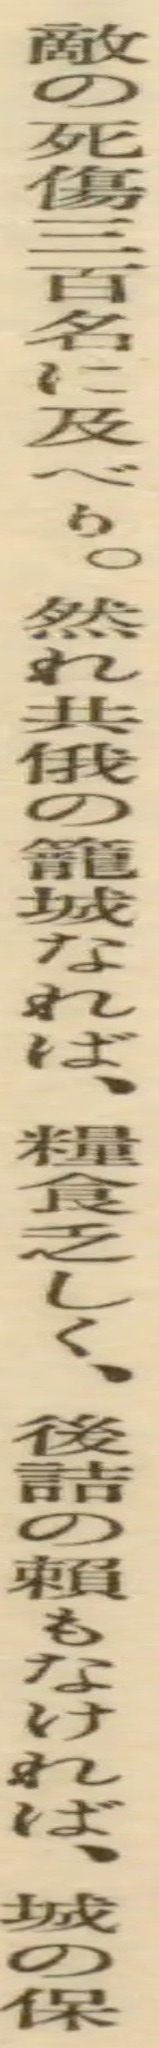敵の死傷三百名に及べり。然れ共俄の籠城なれば、糧食乏しく、後詰の頼もなければ、城の保
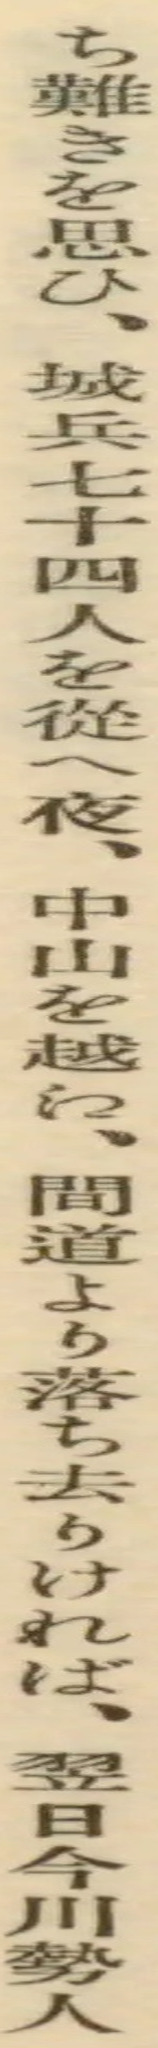ち難きを思ひ、城兵七十四人を従へ夜、中山を越え、間道より落ち去りければ、翌日今川勢人
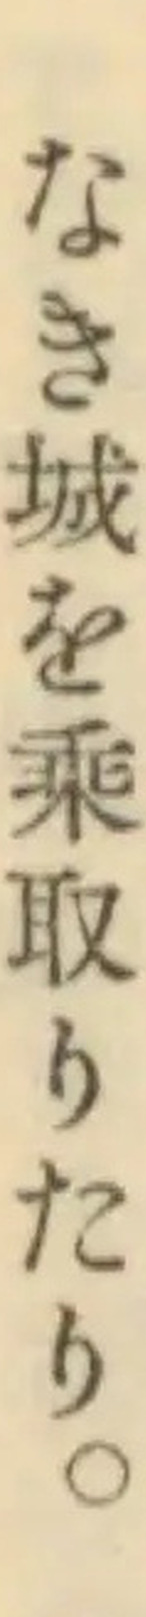なき城を乗取りたり。
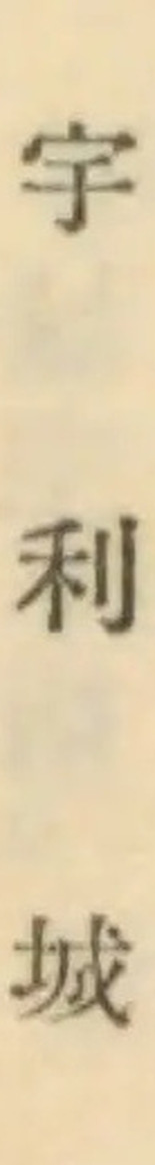宇利城
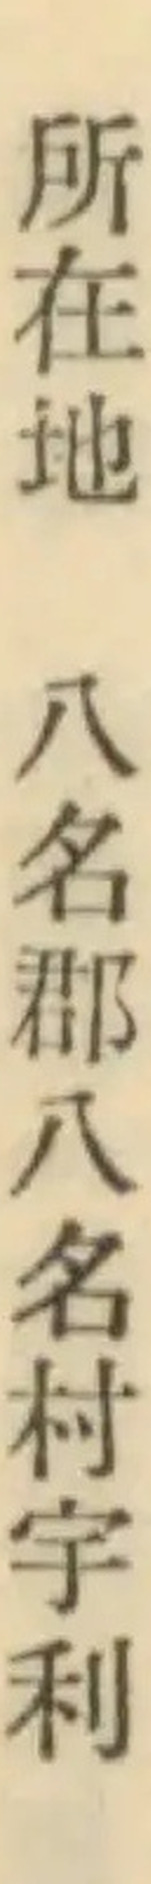所在地八名郡八名村字利
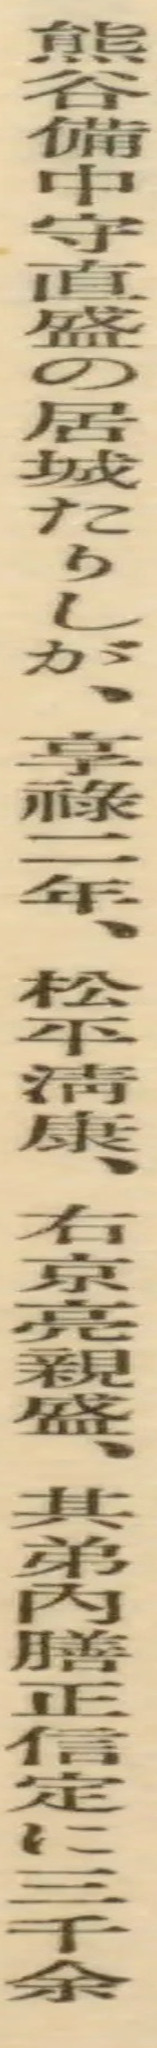熊谷備中守直盛の居城たりしが、享禄二年、松平清康、右京亮親盛、其弟内膳正信定に三千余
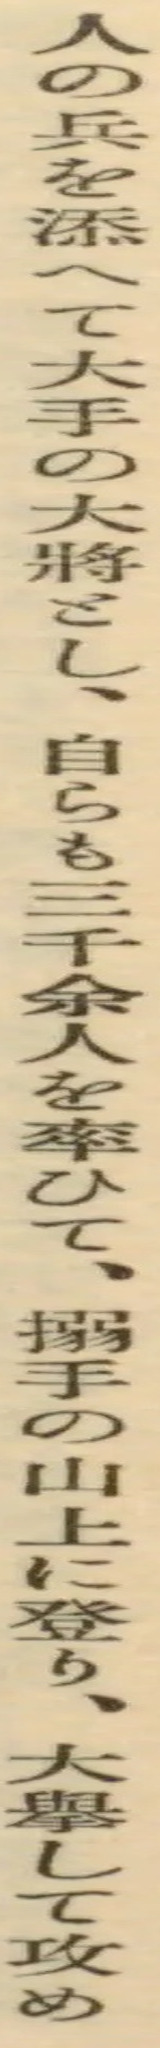人の兵を添へて大手の大将とし、自らも三千余人を率ひて、搦手の山上に登り、大挙して攻め
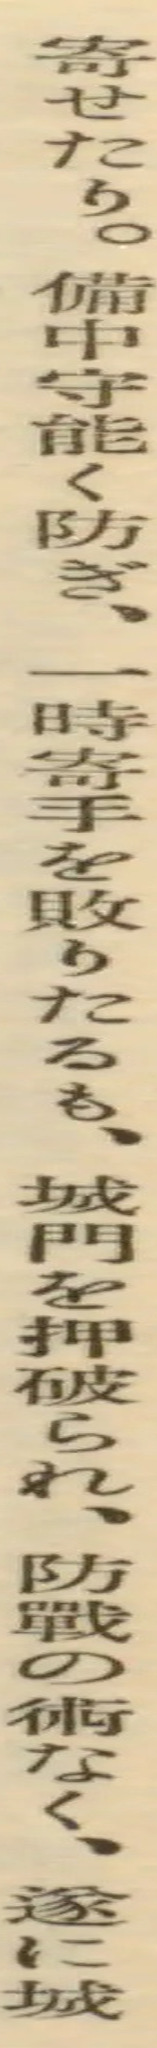寄せたり。備中守能く防ぎ、一時寄手を敗りたるも、城門を押破られ、防戦の術なく、遂に城
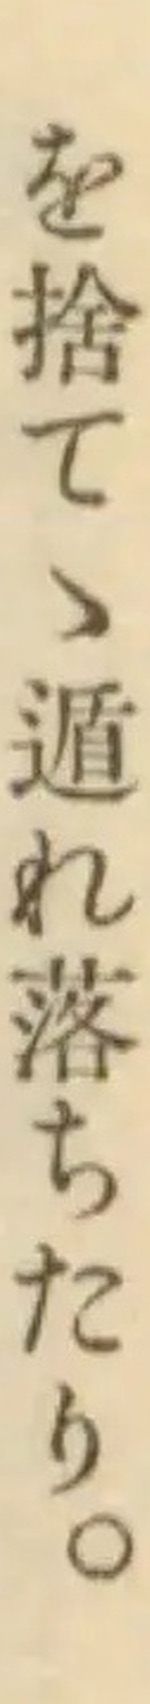を捨てゝ遁れ落ちたり。
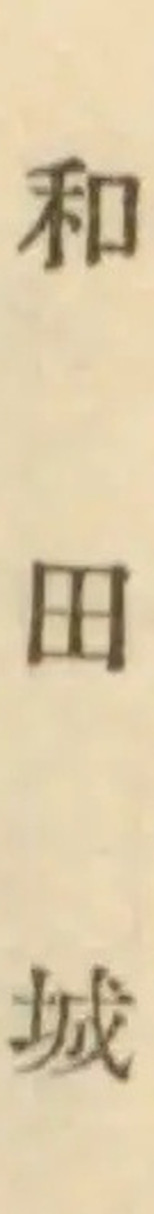和田城
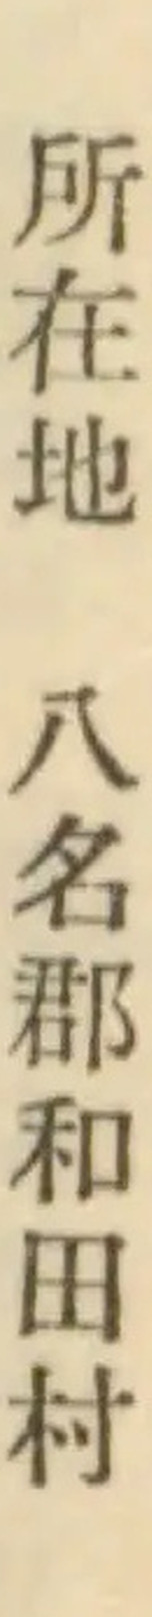所在地八名郡和田村
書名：東三河之古城
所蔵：国立国会図書館 National Diet Library, JAPAN
